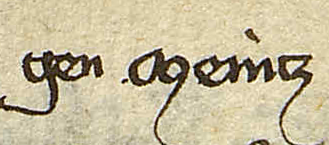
gen Meincʒ
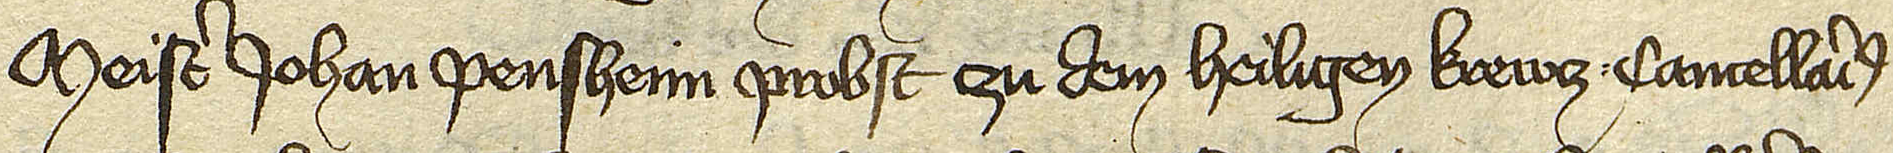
Meiſt* Iohan Penſheim probſt cʒu dem heiligen krewʒ Cancella*i*
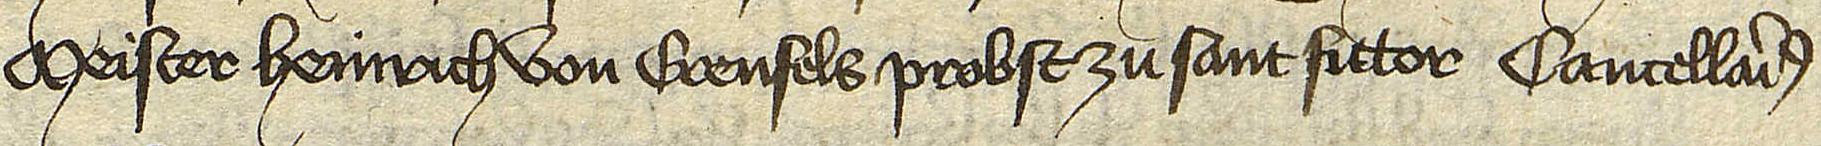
Meiſter heinrich von Erenfels probſt ʒu ſant fictor Cancella*i*
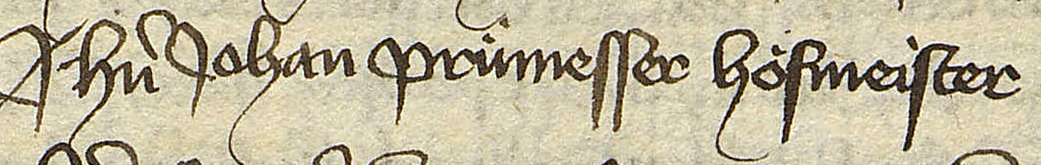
I hn* Iohan Prümeſſer hofmeiſter
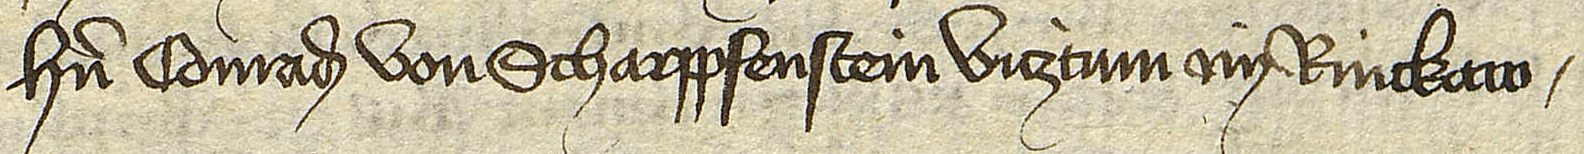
hn* Conrad* von Scharppfenſtein Vicʒtum im Rinckaw /
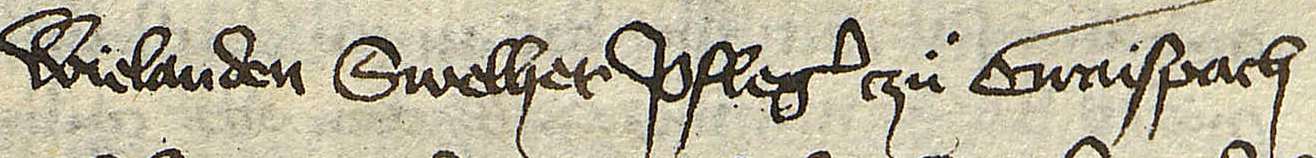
Wielanden Swelher Pfleg* cʒü Graiſpach
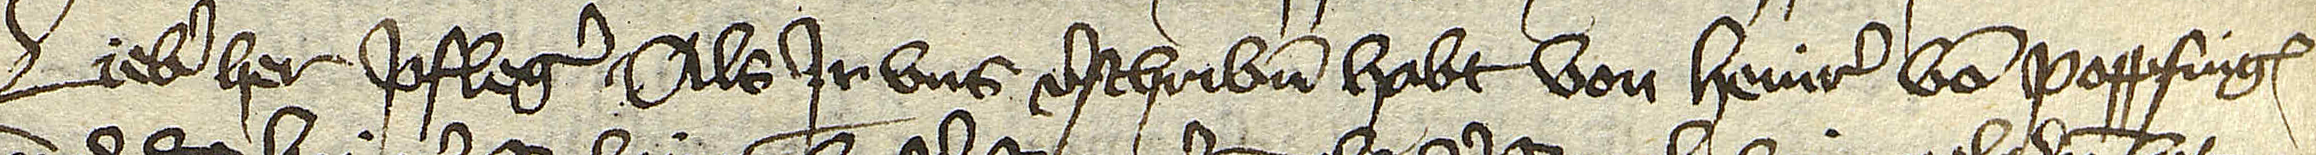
Lieb* her Pfleg* / Als Ir vns v*ſchribn* habt von heinr* vo* Poppfing*
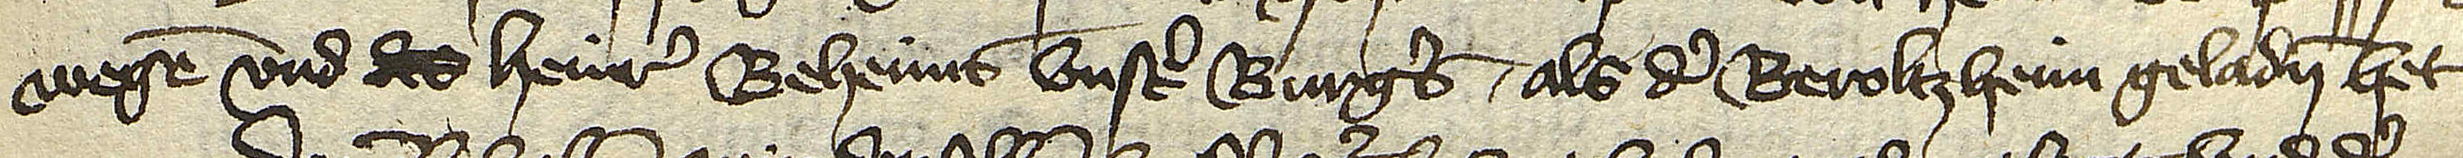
wege* vnd des heinr* Beheims vnſs* Burg*s / als d* Berolcʒheum geladn* het
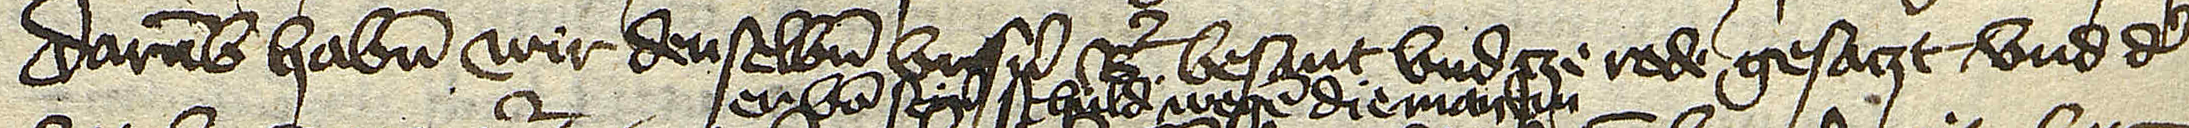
Darub* habn* wir denſelbn* vnſ* B* beſant vnd cʒe rede geſacʒt / vnd d*
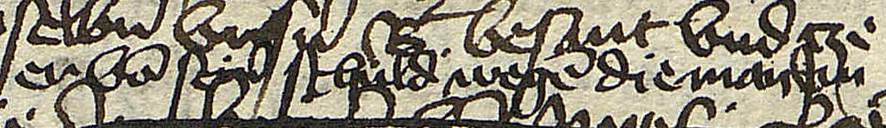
er vo* ſein* ſchuld wege* die man Im
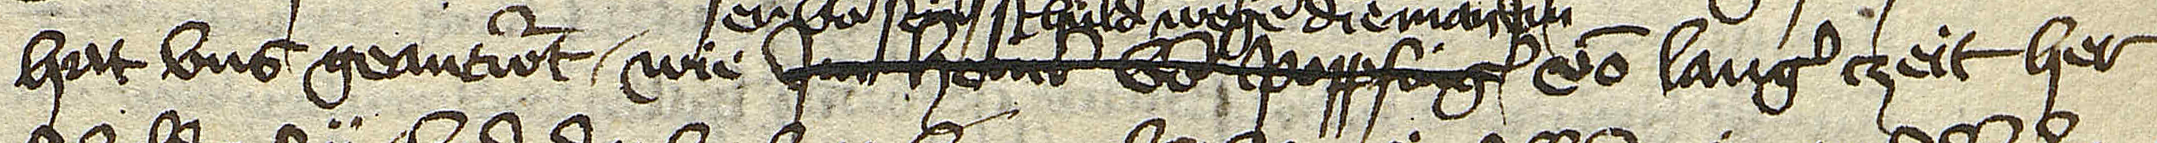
hat vns geantw*t / wie Im heinr* vo* Poppfing* vo* lang* cʒeit her
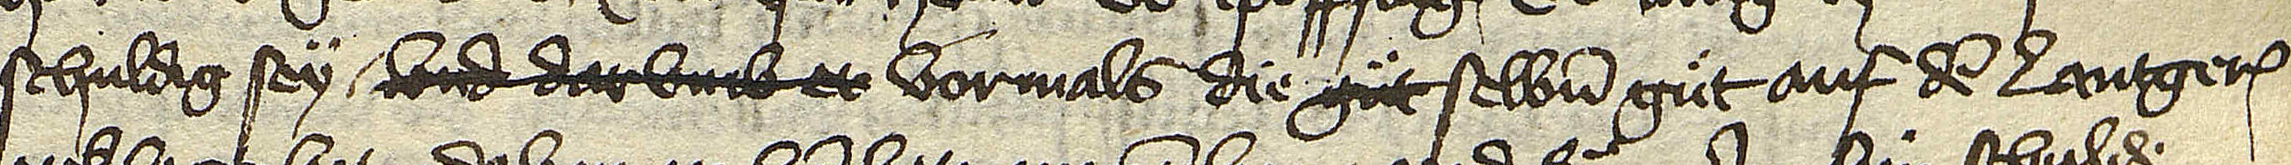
ſchuldig ſey / vnd darvmb er vormals die güt ſelbn* güt auf d* Lantger*
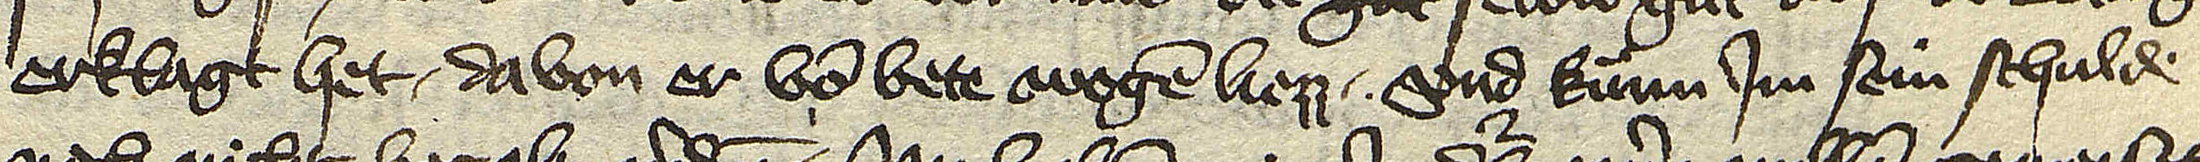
erklagt het / davon er vo* bete wege* lieʒʒ / . vnd künn Im ſein ſchulde
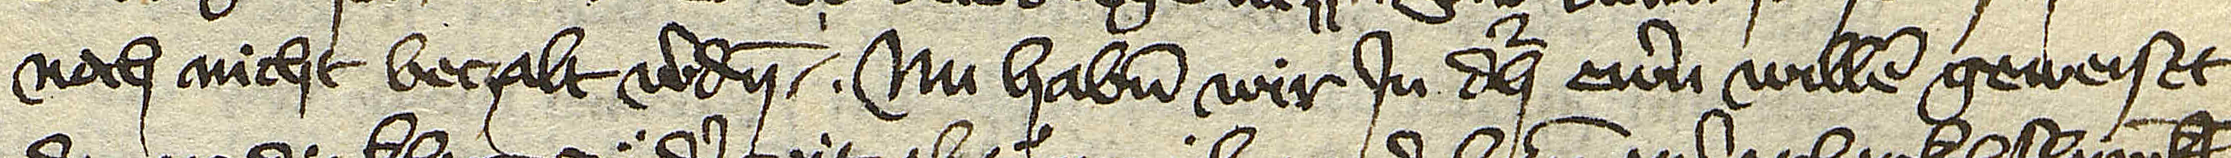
noch nicht becʒalt w*dn* / . Nu habn* wir In d*h ew*n wille* geweiſet
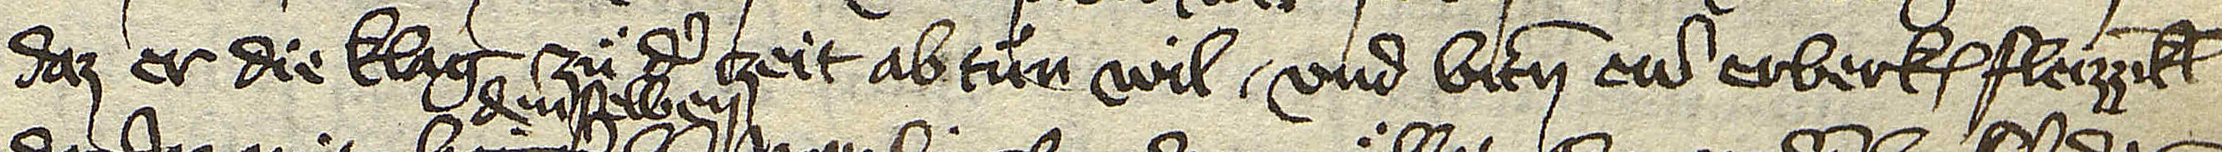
daʒ er die klag cʒü d* cʒeit ab tün wil / vnd bitn* ew* erberk* fleiʒʒikl*
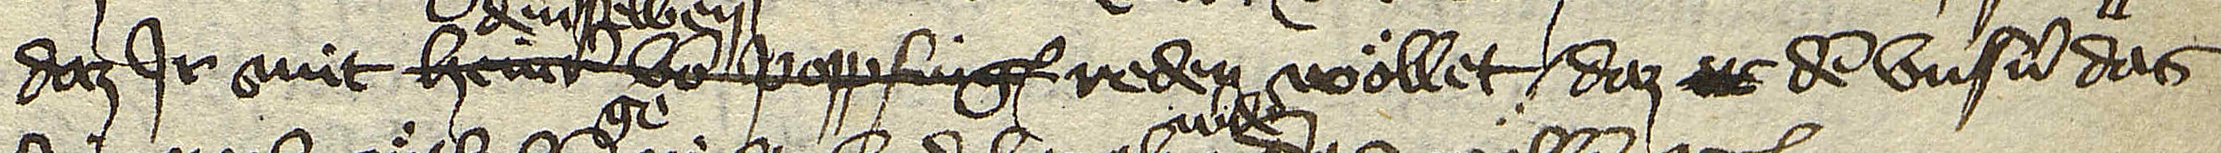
daʒ Ir mit heinr* vo* Poppfing* reden wöllet / daʒ er d* vnſn* das
